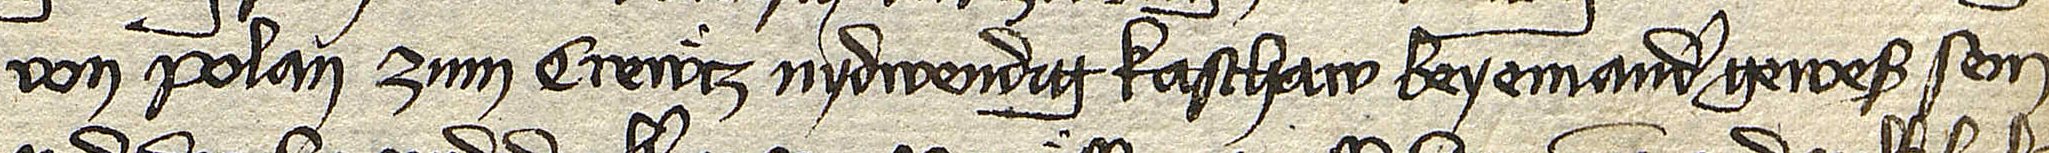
von Polan ʒum Creẅcʒ nydwendig kaſchaw beyeinand* geweſ* ſein
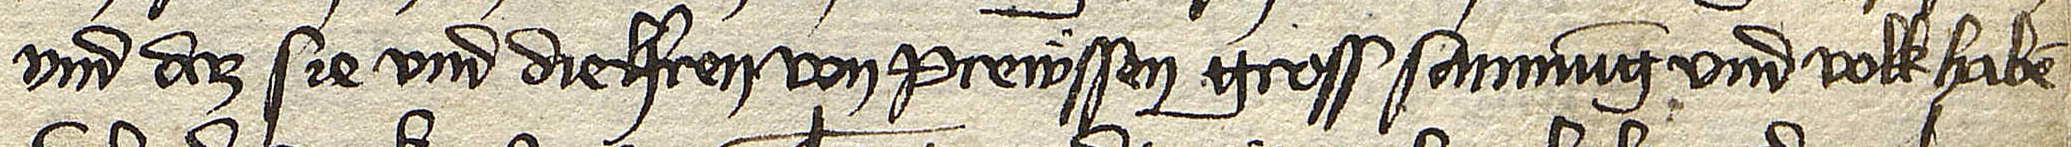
vnd daʒ ſie vnd die h*ren von Preẅſſen groſſ ſammu*g vnd volk habe*
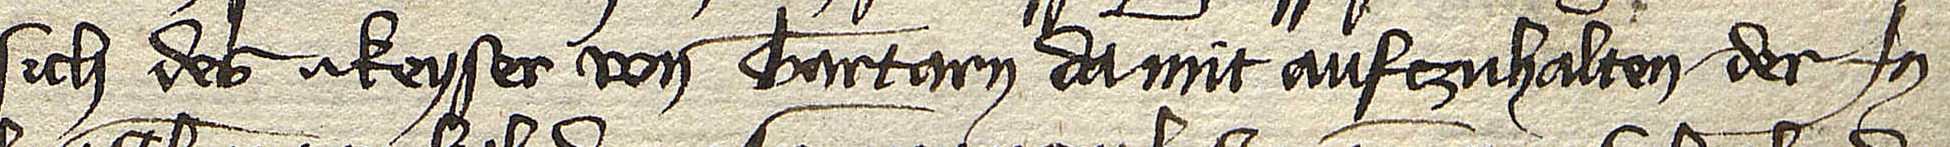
ſich des ~ keyſer von Tartarn da mit aufcʒuhalten / der In
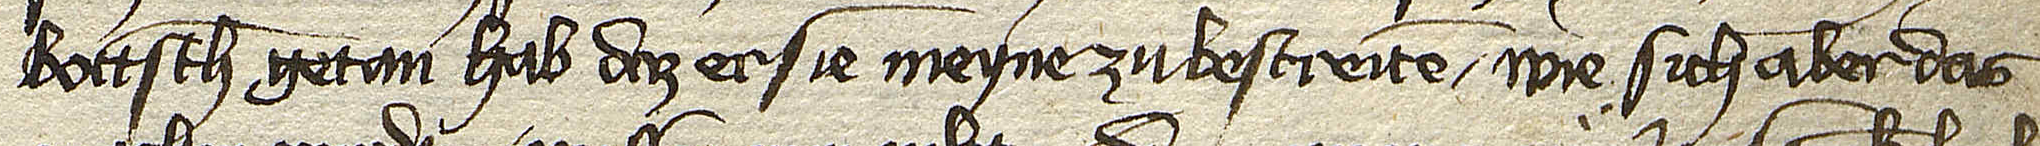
bottſch* getan hab daʒ er ſie meyne ʒu beſtreite* / wie ſich aber das
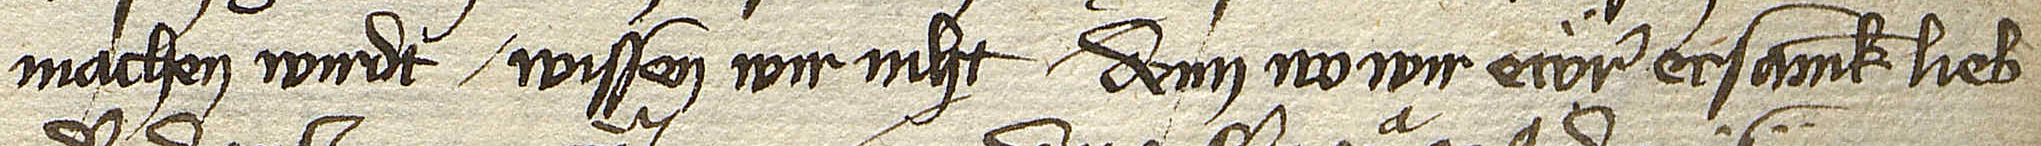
machen wirdt / wiſſen wir niht / denn wo wir eẅr* erſamk* lieb
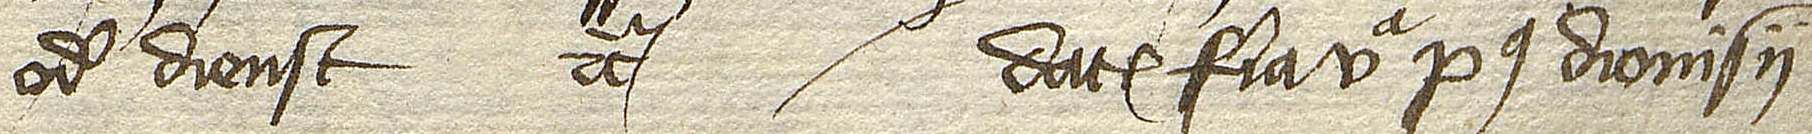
od* dienſt ec* / Dat* fi*a v* p* dioniſii
